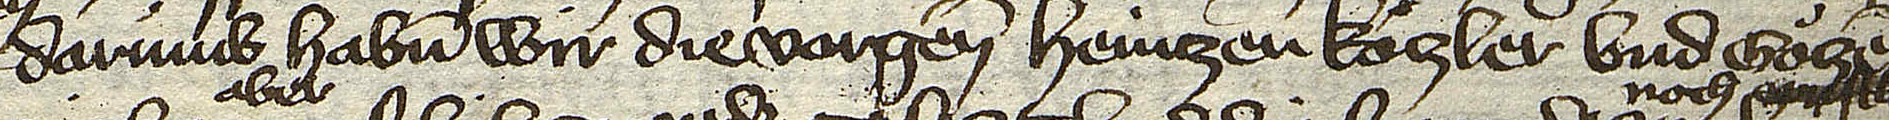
darümb hab*n wir die vorgen* heincʒen köcʒler vnd Göcʒe*
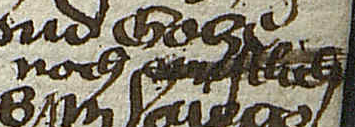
noch ernſtlich
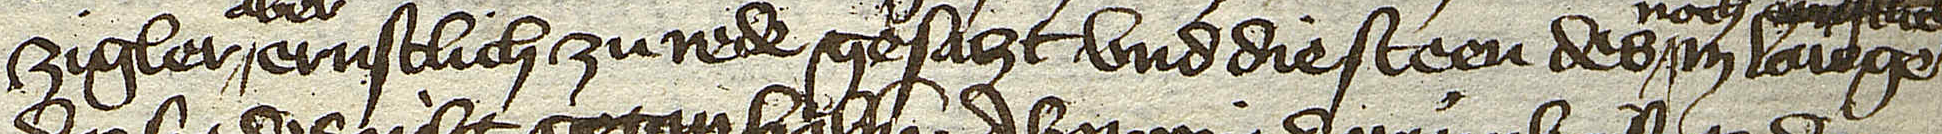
cʒigler ernſtlich cʒu rede geſacʒt / vnd die ſteen des in lange
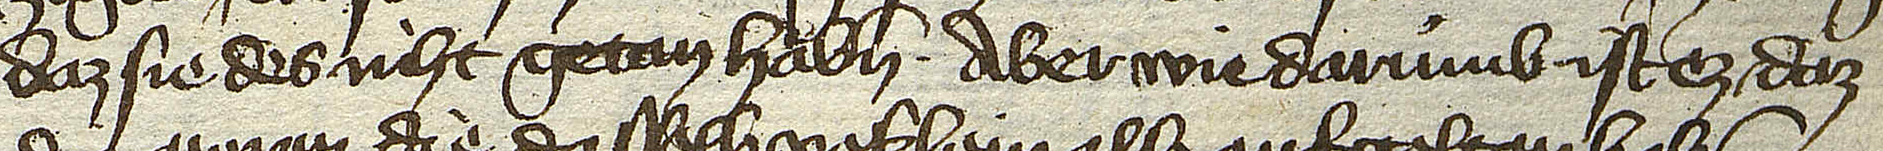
daʒ ſie des niht getan hab*n . Aber wie darümb iſt eʒ / daʒ
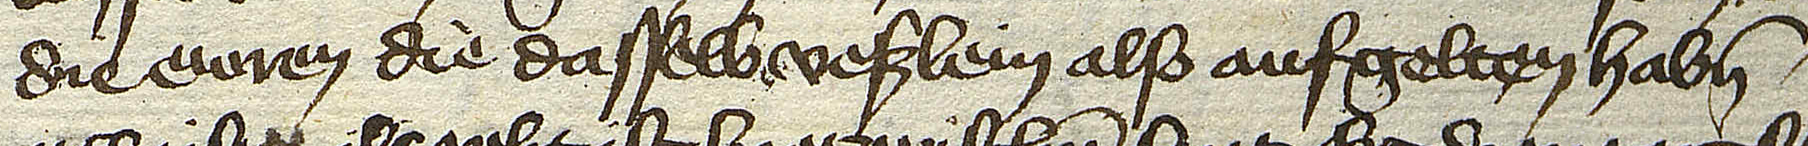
die ewren die daſſelb veſʒlein alſo aufgebten hab*n
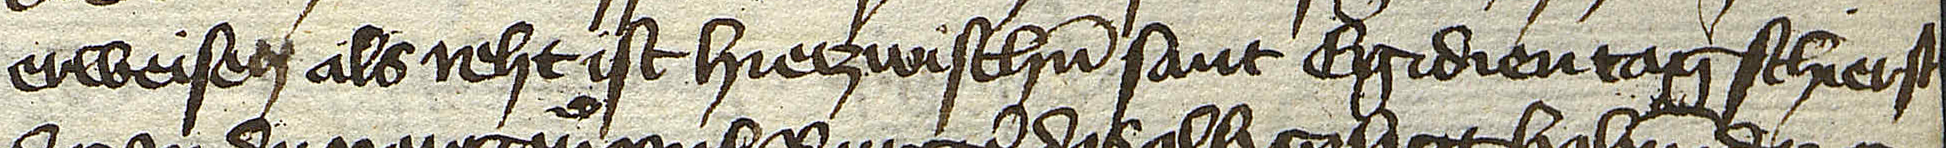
erweiſen als reht iſt hiecʒwiſch*n ſant Egidien tag ſchieriſt
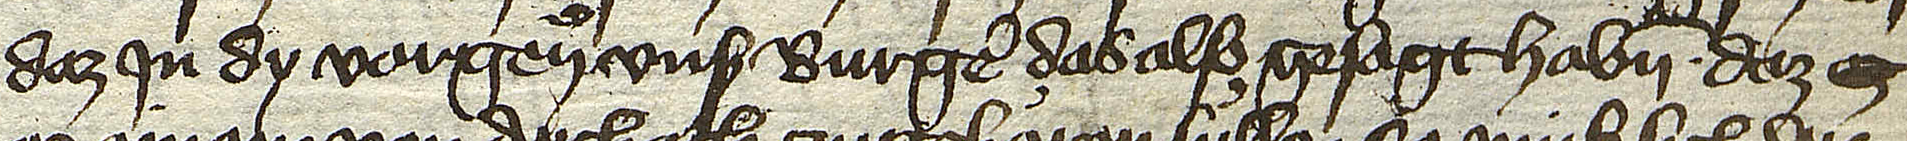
daʒ In dy vorgen* vnſ* Burge* das alſo geſagt hab*n . daʒ eʒ
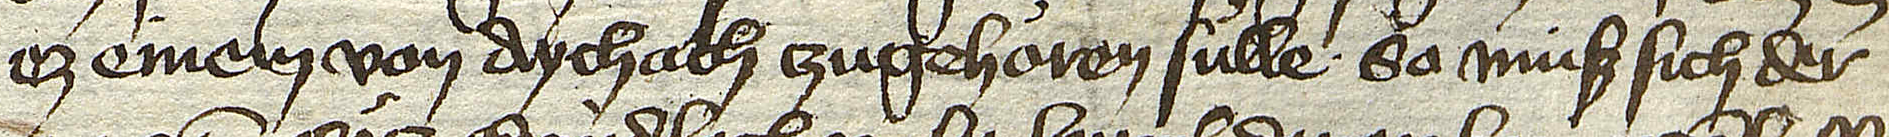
eʒ einem von Aychach cʒugehören ſülle . So muſʒ ſich der
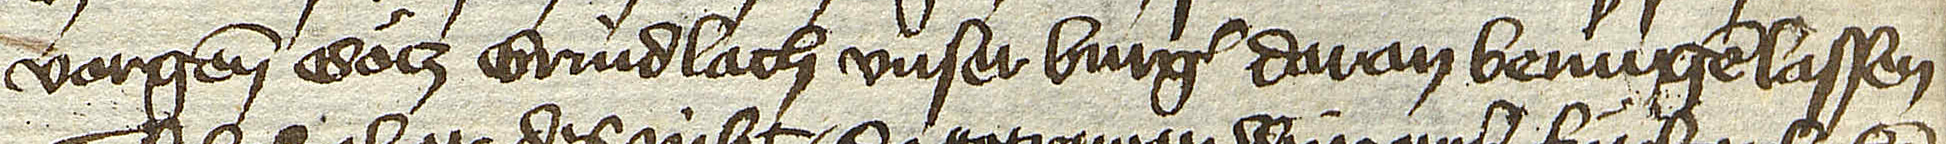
vorgen* Göcʒ Grindlach vnſer burg* daran benuge* laſſen
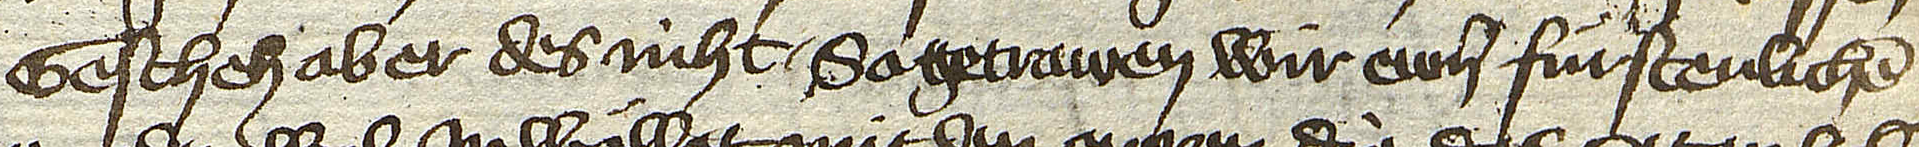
Geſcheh aber des niht / So getrawen wir ew*n fürſtenliche*
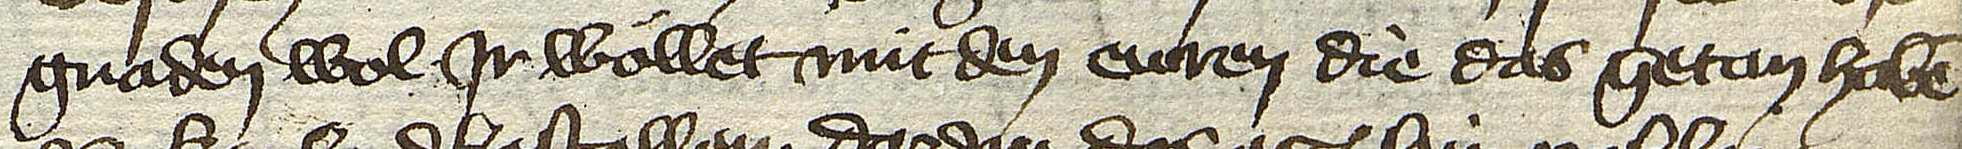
gnaden wol . Ir wöllet mit den ewren die das getan habe*
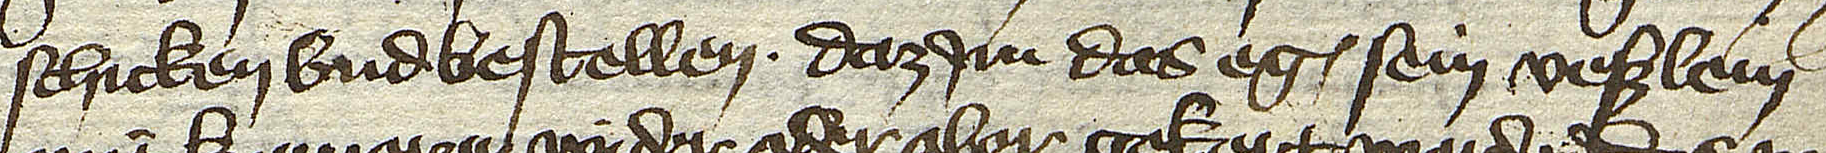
ſchicken vnd beſtellen . daʒ Im das eg* ſein veſʒlein
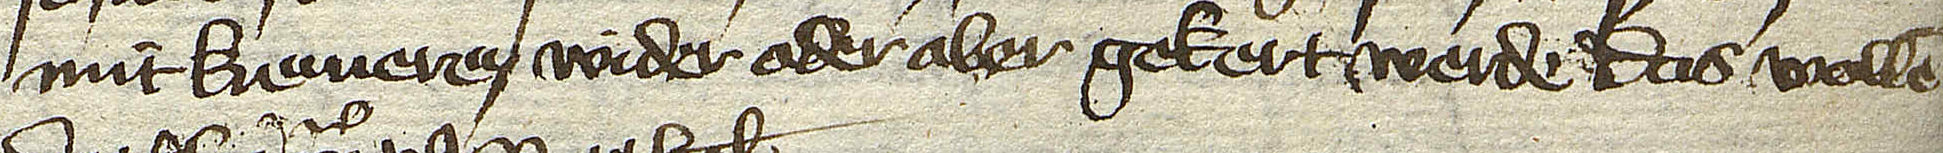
mit kremerey wider oder aber gekert werde Das welle*
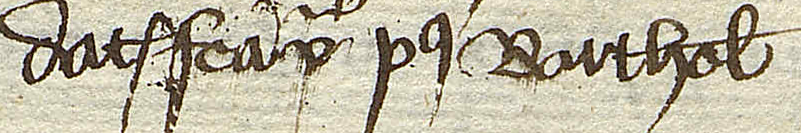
dat* fea* v* p* Barthol*
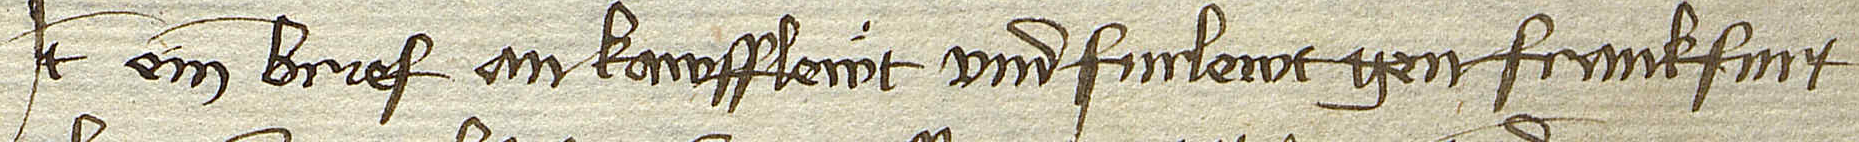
It* ein* brief an kawfflewt vnd furlewt gen frankfurt
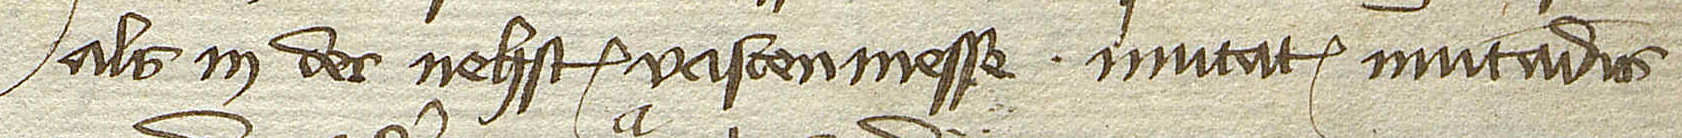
als in der nehſt* vaſten meſſe . mutat* muta*dis
